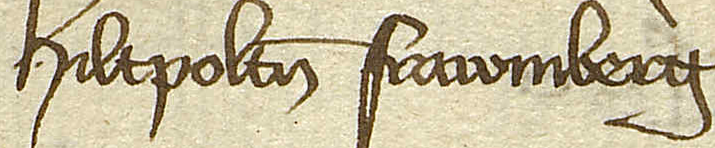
Hiltpoltn* Frawmberg*
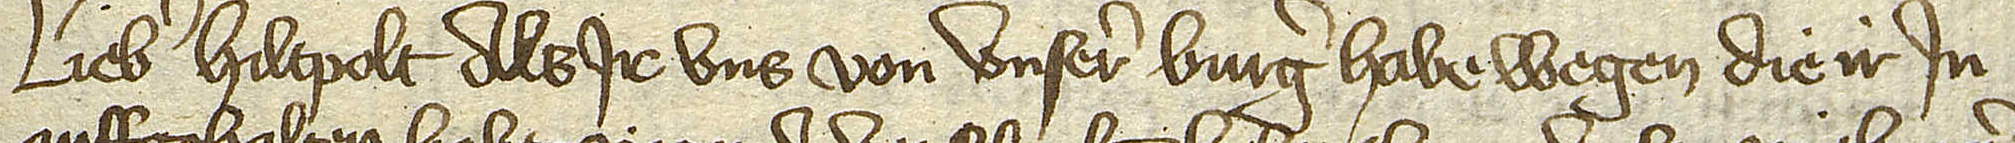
Lieb* hilpolt Als Ir vns von vnſer* burg* habe wegen die ir In
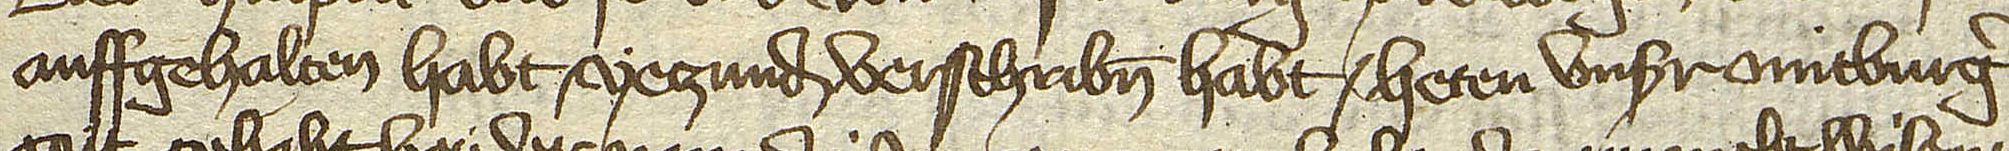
auffgehalten habt / yecʒund* verſchribn* habt / heten vnſ*r mitburg*
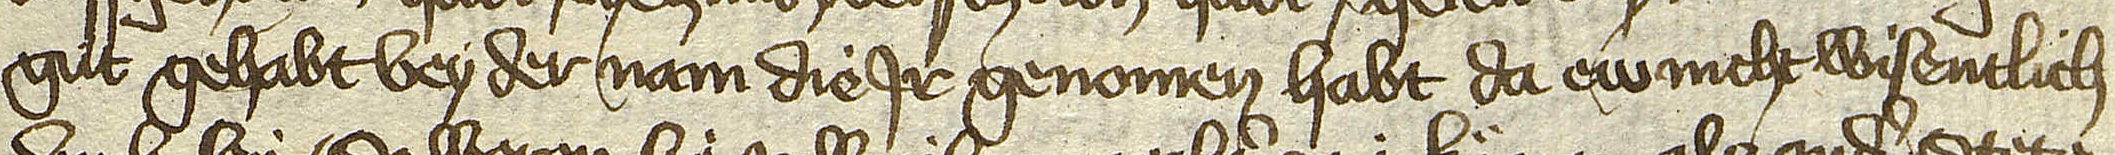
güt gehabt bey der nam die Ir genomen habt da ew nicht wiſentlich
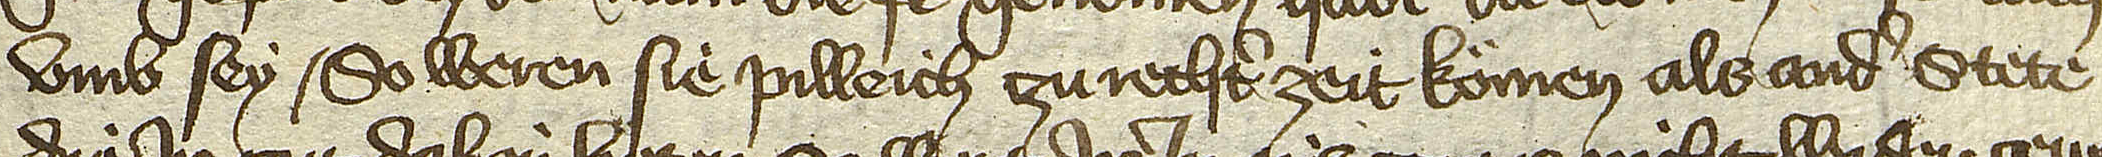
vmb ſey / So weren ſie pilleich cʒu recht* cʒeit kömen als and* Stete
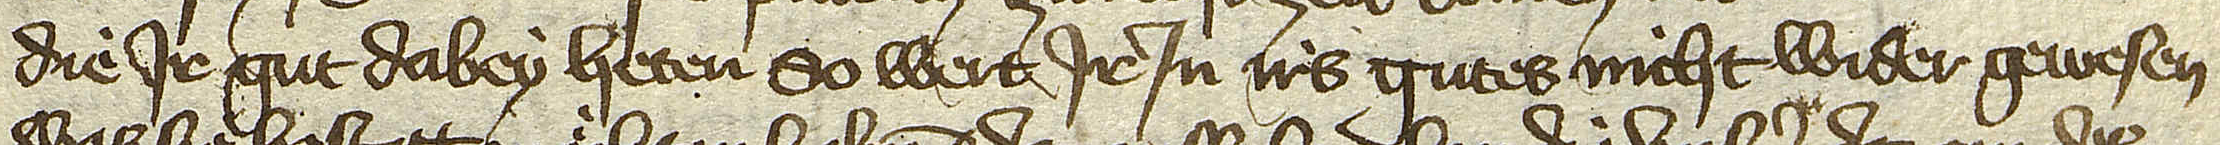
die Ir gut dabey heten So wert Ir In irs gutes nicht wider geweſen
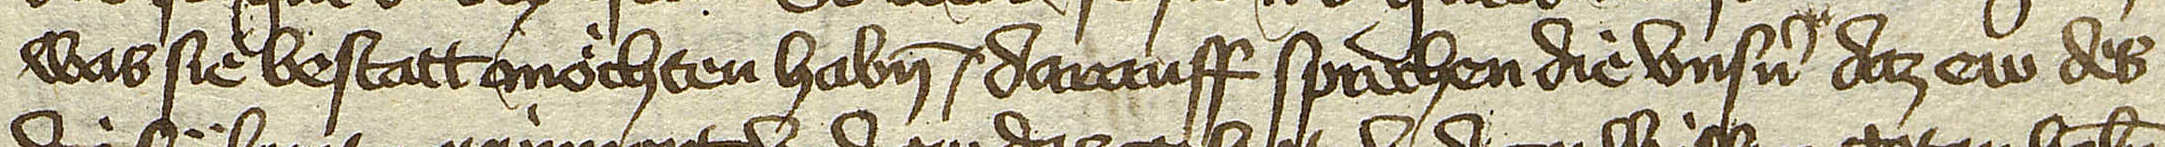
was ſie beſtatt möchten habn* / darauff ſprechen die vnſn* daʒ ew des
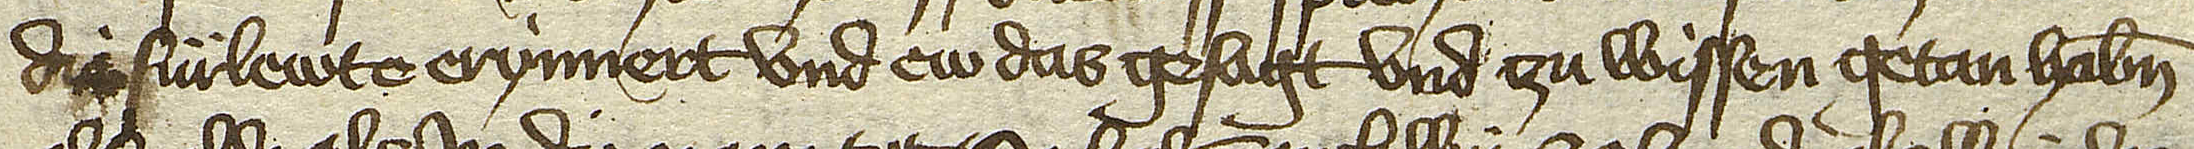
die fürlewte erynnert vnd ew das geſagt vnd cʒu wiſſen getan habn*
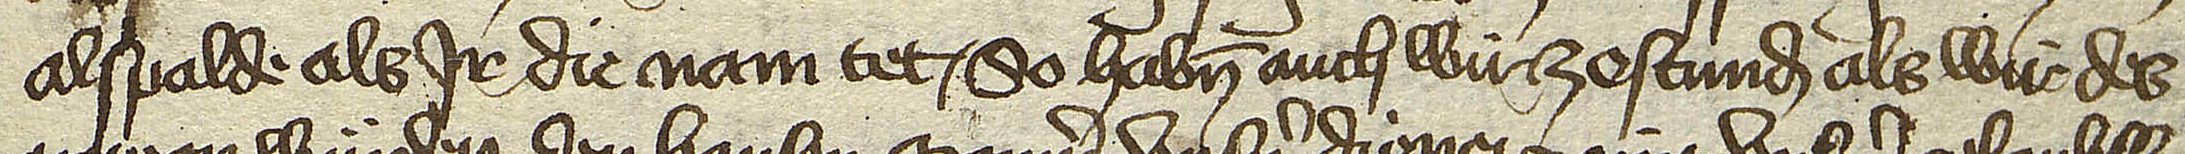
alſpalde als Ir die nam tet / So habn* auch wir cʒeſtund* als wir des
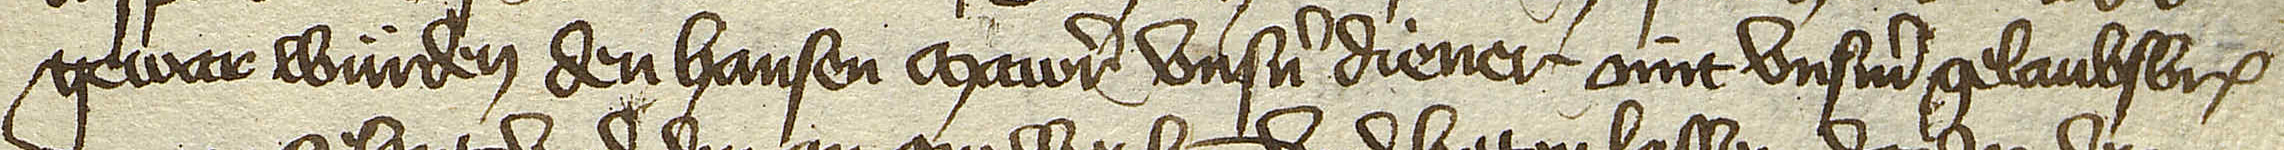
gewar würden den hanſen Mawr* vnſn* diener mit vnſm* gelaubſbr*
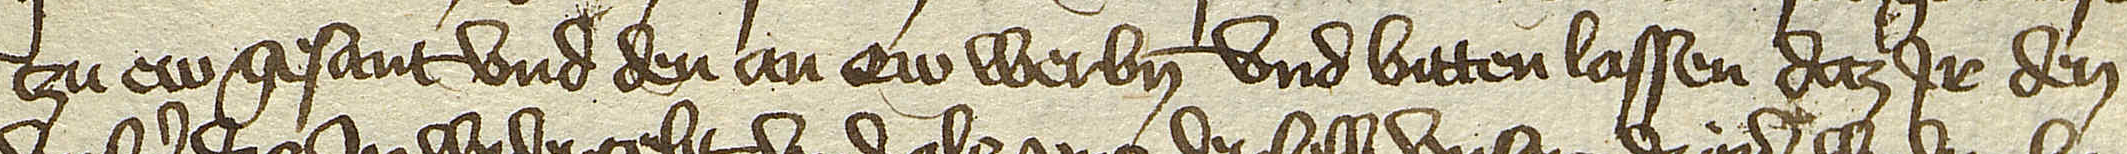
cʒu ew geſant vnd den an ew werbn* vnd bitten laſſen daʒ Ir den
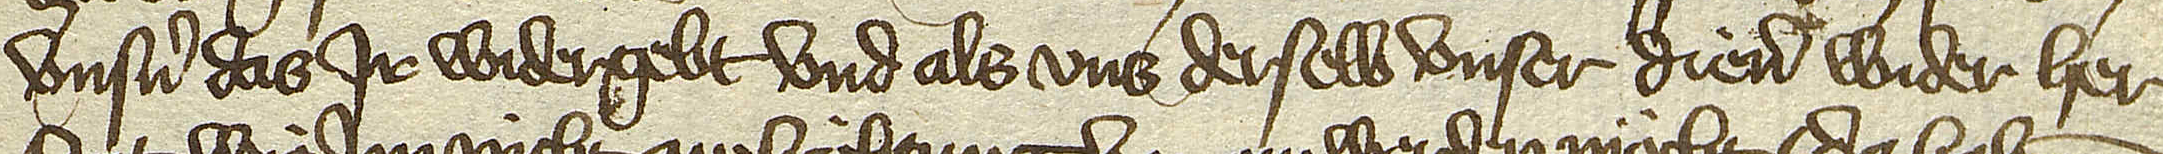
vnſn* das Ir widergebt vnd als vns derſelb vnſer dien* wider her
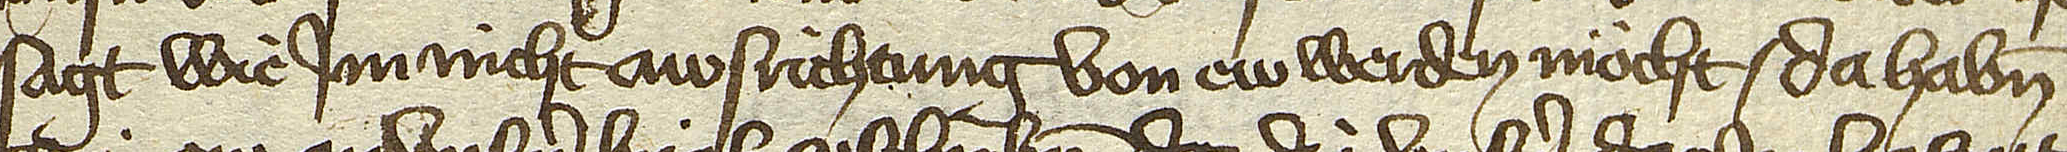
ſagt wie Im nicht awſrichtung von ew werden möcht / da habn*
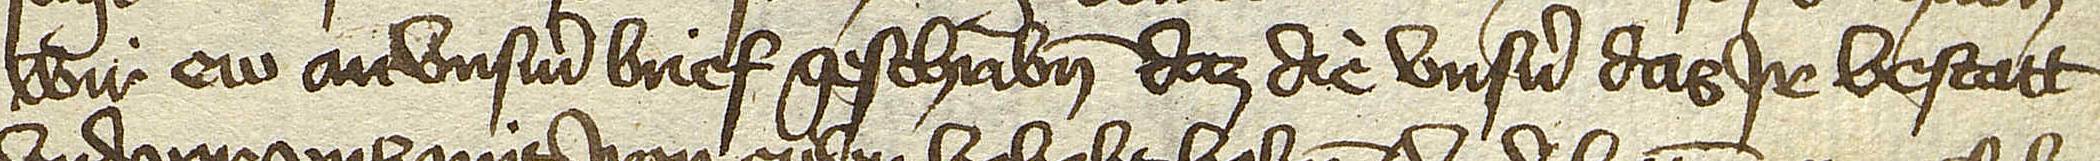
wir ew an vnſm* brief geſchribn* daʒ die vnſn* das Ir bestatt
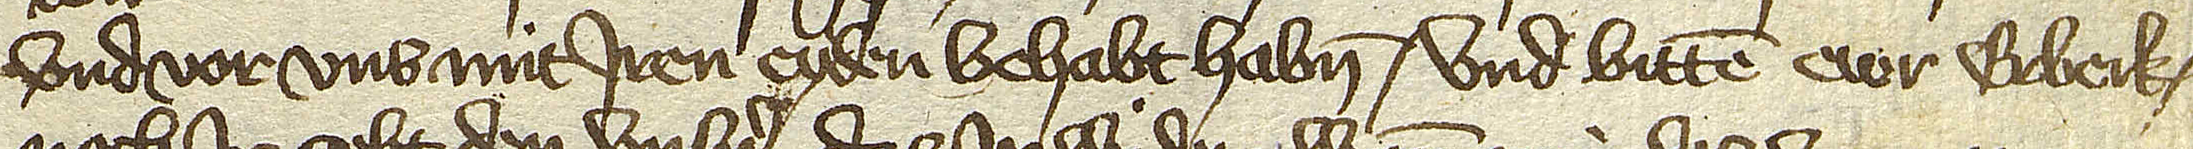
vnd vor vns mit Iren eyden behabt habn* / vnd bitte* ewr Erberk*
